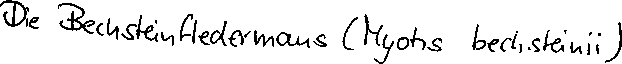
Die Bechsteinfledermaus (Myotis bechsteinii)
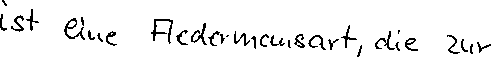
ist eine Fledermausart, die zur
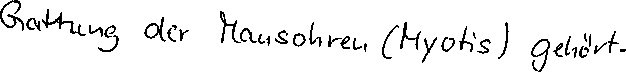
Gattung der Mausohren (Myotis) gehört.
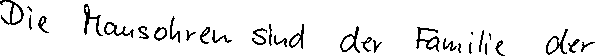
Die Mausohren sind der Familie der
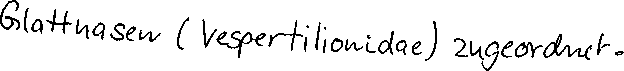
Glattnasen (Vespertilionidae) zugeordnet.
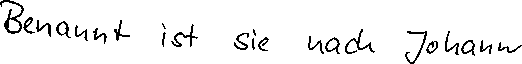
Benannt ist sie nach Johann
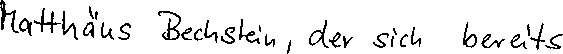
Matthäus Bechstein, der sich bereits
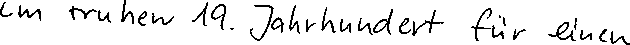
im frühen 19. Jahrhundert für einen
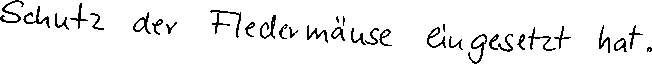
Schutz der Fledermäuse eingesetzt hat.
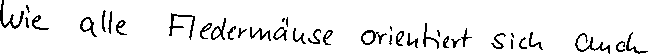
Wie alle Fledermäuse orientiert sich auch
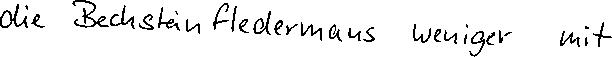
die Bechsteinfledermaus weniger mit
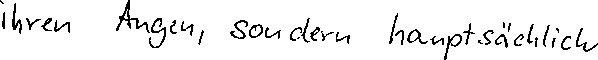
ihren Augen, sondern hauptsächlich
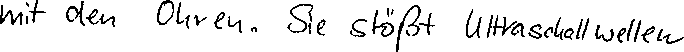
mit den Ohren. Sie stößt Ultraschallwellen
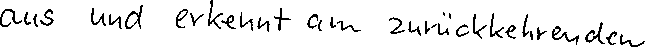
aus und erkennt am zurückkehrenden
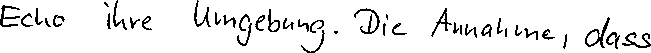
Echo ihre Umgebung. Die Annahme, dass
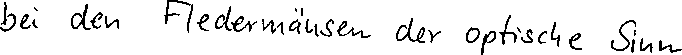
bei den Fledermäusen der optische Sinn
